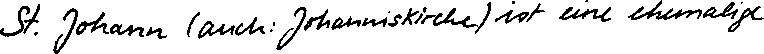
St. Johann (auch: Johanniskirche) ist eine ehemalige
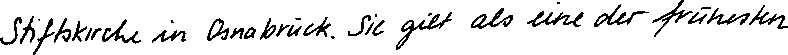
Stiftskirche in Osnabrück. Sie gilt als eine der frühesten
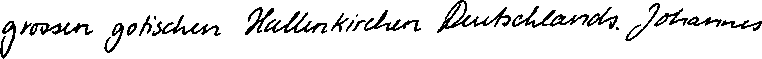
großen gotischen Hallenkirchen Deutschlands. Johannes
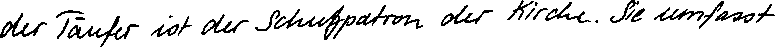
der Täufer ist der Schutzpatron der Kirche. Sie umfasst
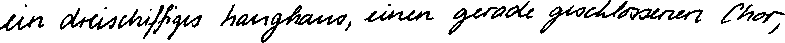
ein dreischiffiges Langhaus, einen gerade geschlossenen Chor,
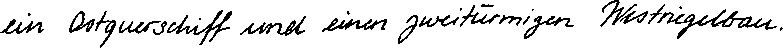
ein Ostquerschiff und einen zweitürmigen Westriegelbau.
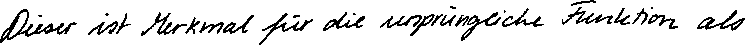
Dieser ist Merkmal für die ursprüngliche Funktion als
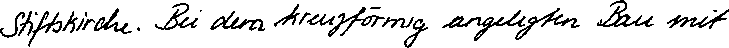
Stiftskirche. Bei dem kreuzförmig angelegten Bau mit
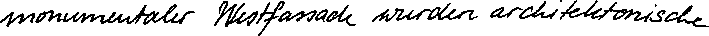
monumentaler Westfassade wurden architektonische
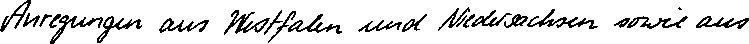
Anregungen aus Westfalen und Niedersachsen sowie aus
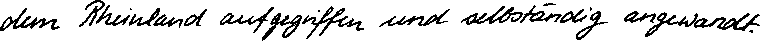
dem Rheinland aufgegriffen und selbständig angewandt.
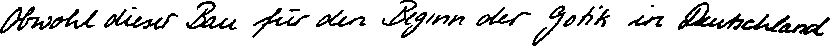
Obwohl dieser Bau für den Beginn der Gotik in Deutschland
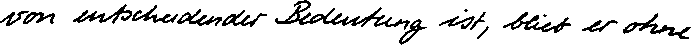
von entscheidender Bedeutung ist, blieb er ohne
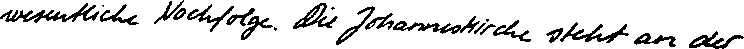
wesentliche Nachfolge. Die Johanniskirche steht an der
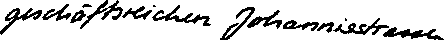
geschäftsreichen Johannisstraße
